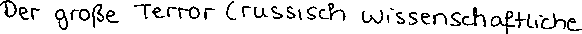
Der Große Terror (russisch wissenschaftliche
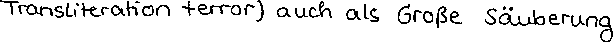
Transliteration terror) auch als Große Säuberung
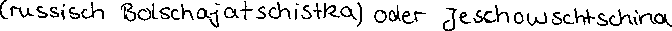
(russisch Bolschaja tschistka) oder Jeschowschtschina
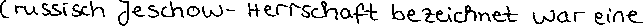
(russisch Jeschow-Herrschaft bezeichnet war eine
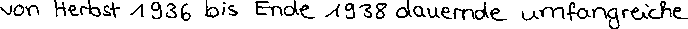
von Herbst 1936 bis Ende 1938 dauernde umfangreiche
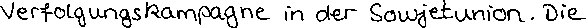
Verfolgungskampagne in der Sowjetunion. Die
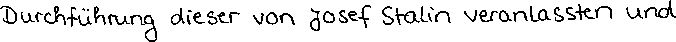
Durchführung dieser von Josef Stalin veranlassten und
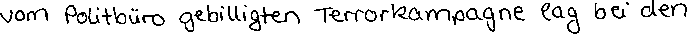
vom Politbüro gebilligten Terrorkampagne lag bei den
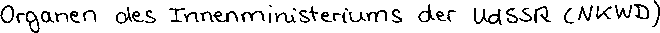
Organen des Innenministeriums der UdSSR (NKWD)
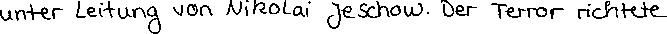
unter Leitung von Nikolai Jeschow. Der Terror richtete
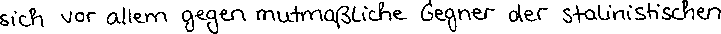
sich vor allem gegen mutmaßliche Gegner der stalinistischen
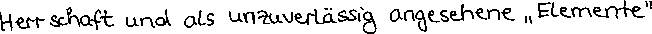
Herrschaft und als unzuverlässig angesehene "Elemente"
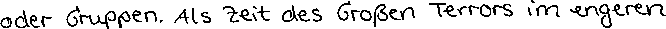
oder Gruppen. Als Zeit des Großen Terrors im engeren
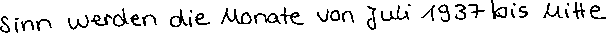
Sinn werden die Monate von Juli 1937 bis Mitte
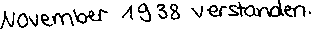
November 1938 verstanden.
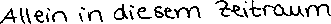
Allein in diesem Zeitraum
